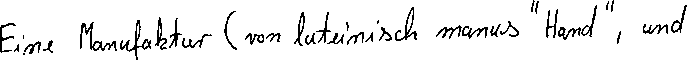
Eine Manufaktur (von lateinisch manus "Hand", und
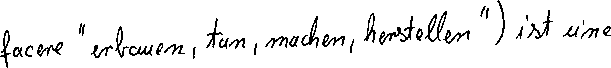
facere "erbauen, tun, machen, herstellen") ist eine
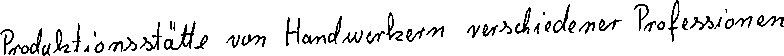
Produktionsstätte von Handwerkern verschiedener Professionen
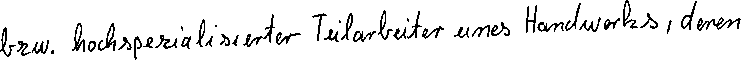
bzw. hochspezialisierter Teilarbeiter eines Handwerks, deren
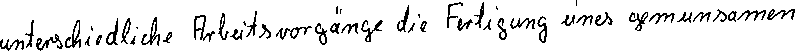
unterschiedliche Arbeitsvorgänge die Fertigung eines gemeinsamen
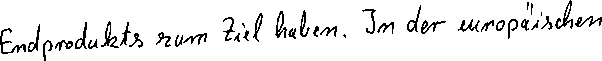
Endprodukts zum Ziel haben. In der europäischen
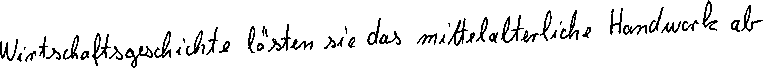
Wirtschaftsgeschichte lösten sie das mittelalterliche Handwerk ab
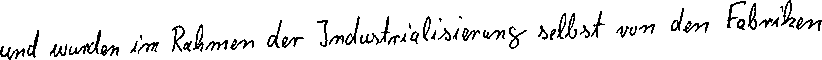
und wurden im Rahmen der Industrialisierung selbst von den Fabriken
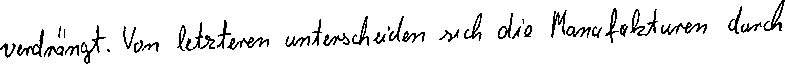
verdrängt. Von letzteren unterscheiden sich die Manufakturen durch
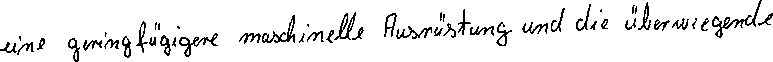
eine geringfügigere maschinelle Ausrüstung und die überwiegende
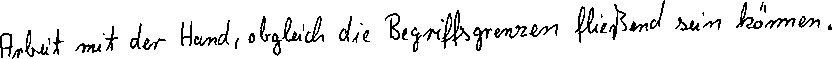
Arbeit mit der Hand, obgleich die Begriffsgrenzen fließend sein können.
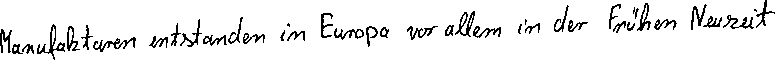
Manufakturen entstanden in Europa vor allem in der Frühen Neuzeit
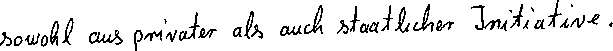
sowohl aus privater als auch staatlicher Initiative.
